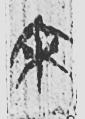宋
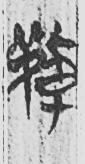{歺卓}
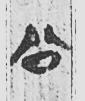公
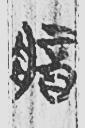𨟻
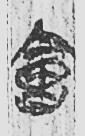會
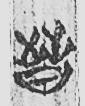晉
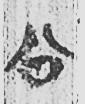公
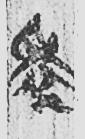卒B
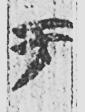于
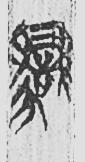{䌛犬}
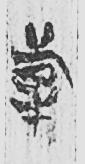倝
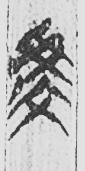虔
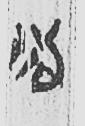{少勺}
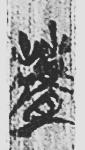蔖
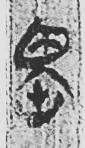{鬼山}
